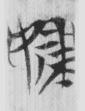婦
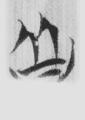皆
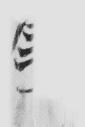𩁹
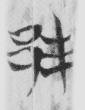邦
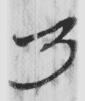乃
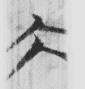大
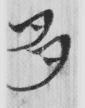多
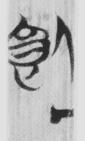飤
